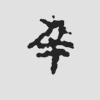南
